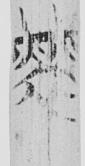○（勞）
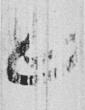㠯（以）
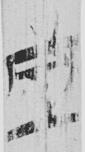城（成）
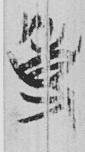事
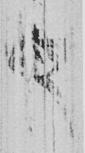色
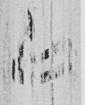㠯（以）
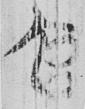官
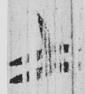士
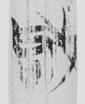○（治）
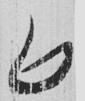㠯（以）
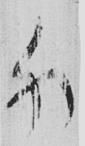力
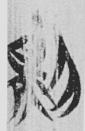則
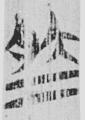○（俎）
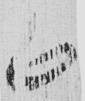㠯（以）
